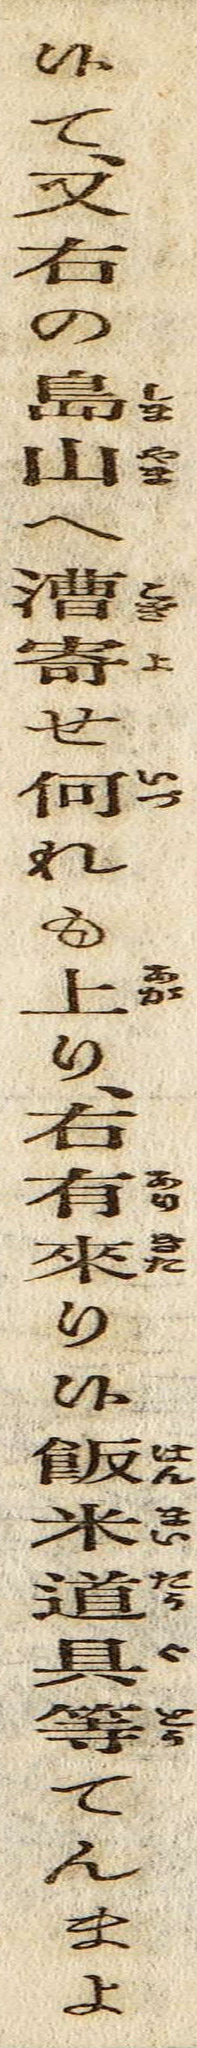候て、又右の島山へ漕寄せ何れも上り、右有来り候飯米道具等てんまよ
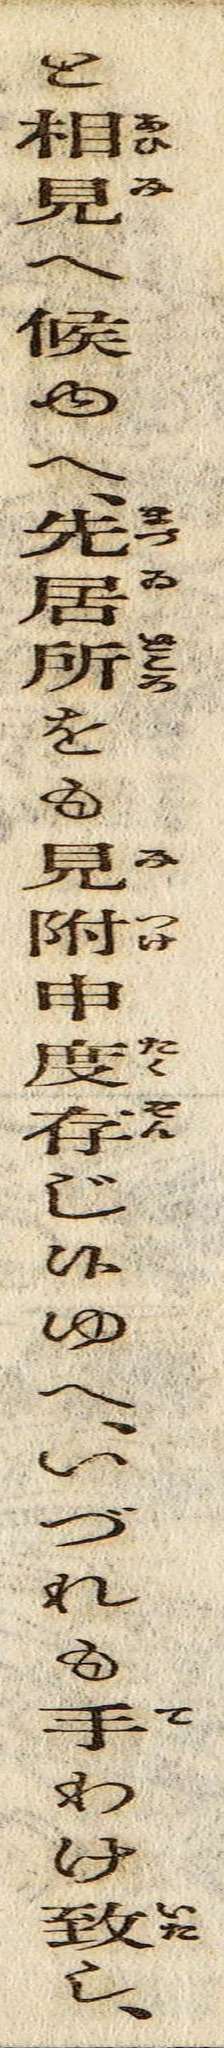と相見へ候ゆへ、先居所をも見附申度存じ候ゆへ、いづれも手わけ致し、
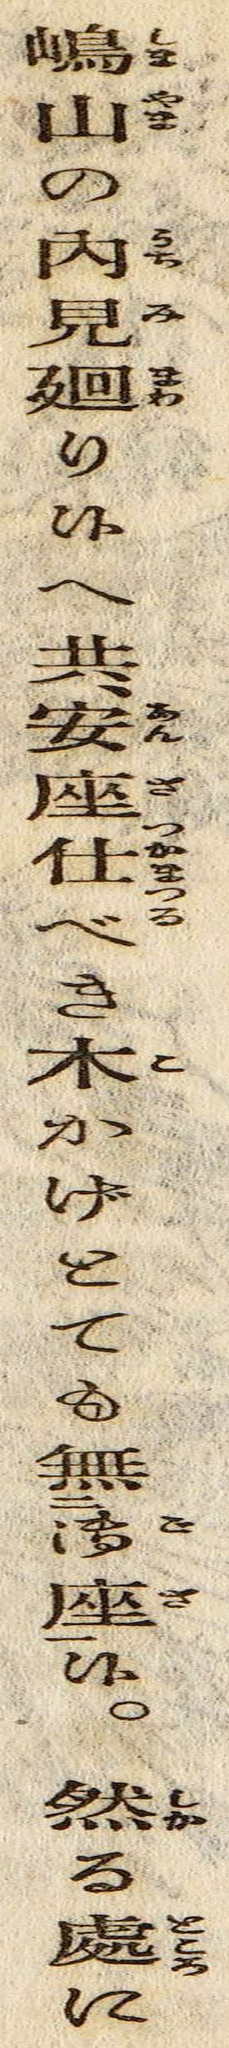嶋山の内見廻り候へ共、安座仕べき木かげとても無御座候。然る処に
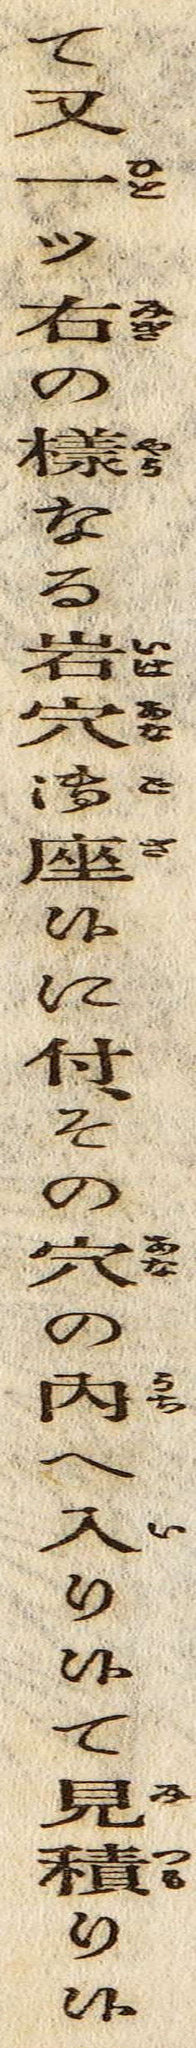て又一ツ右の様なる岩穴御座候に付、その穴の内へ入り候て見積り候
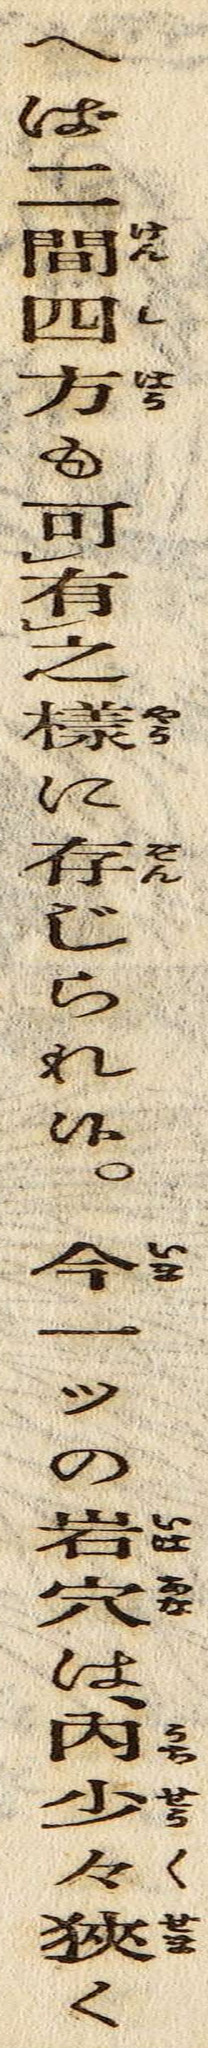へば二間四方も可有之様に存じられ候。今一ツの岩穴は、内少々狭く
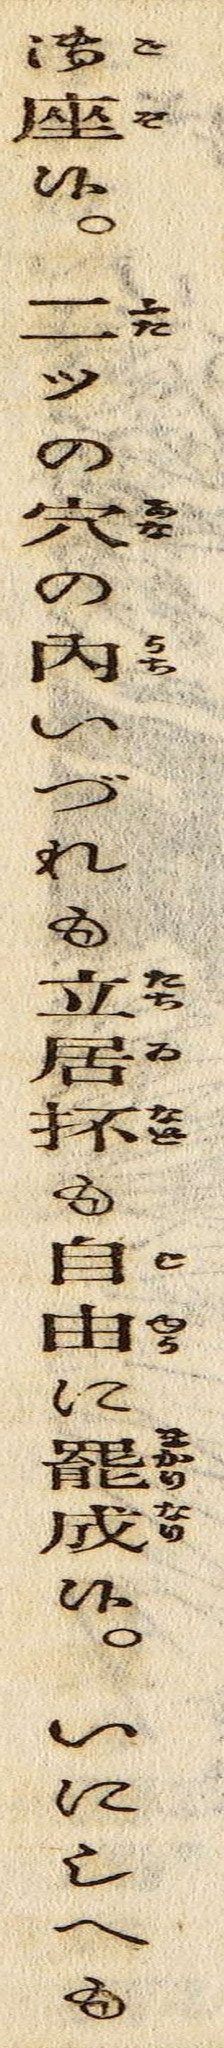御座候。二ツの穴の内いづれも立居抔も自由に罷成候。いにしへも
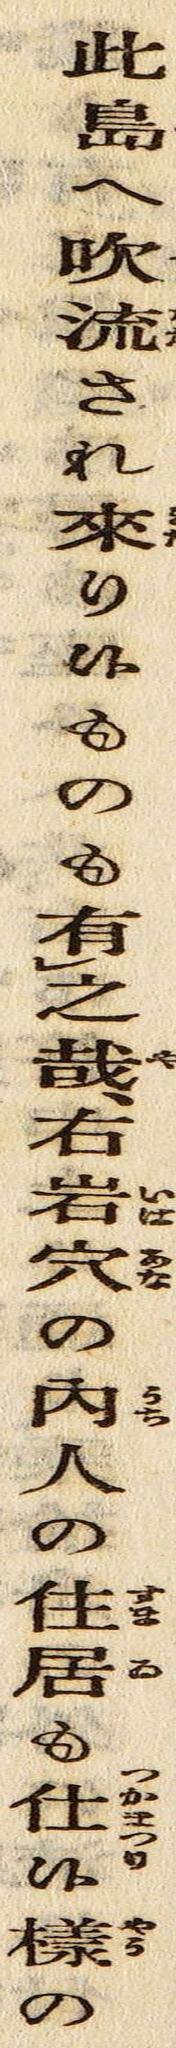此島へ吹流され来り候ものも有之哉、右岩穴の内人の住居も仕候様の
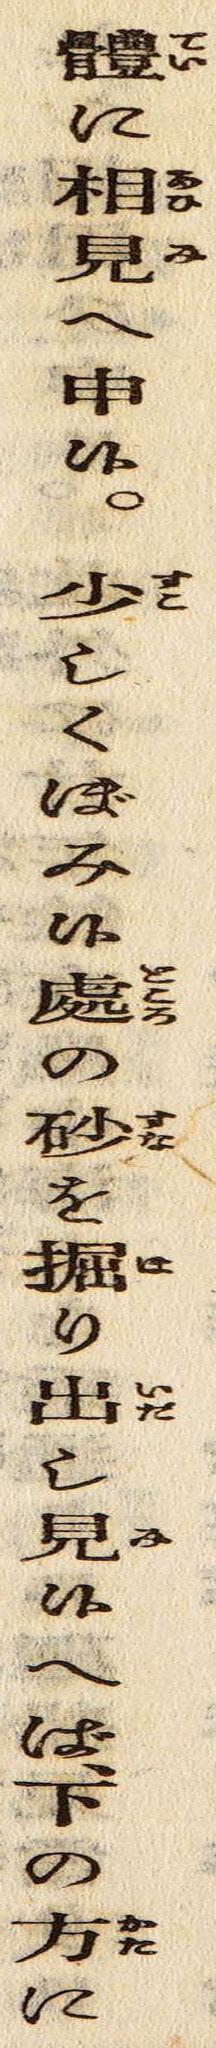体に相見へ申候。少しくぼみ候処の砂を掘り出し見候へば、下の方に
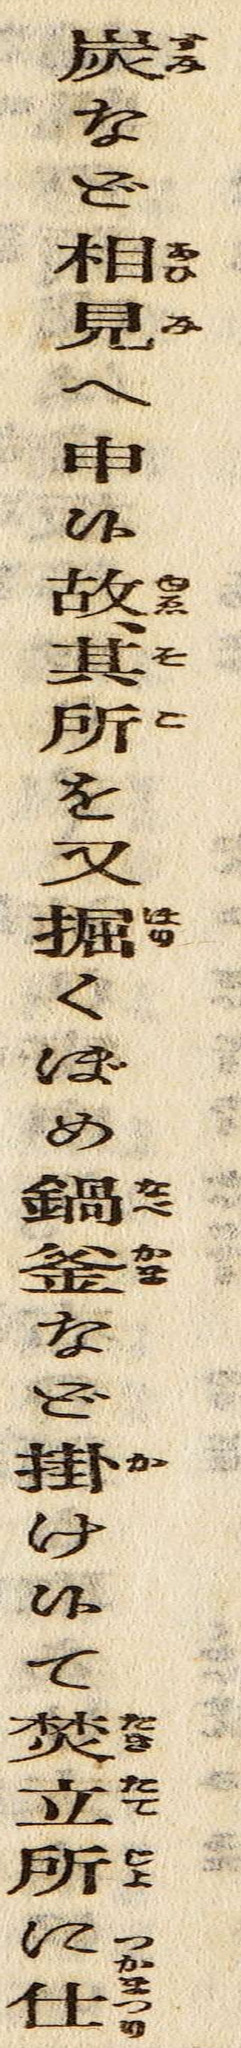炭など相見へ申候故、其所を又掘くぼめ鍋釜など掛け候て焚立所に仕
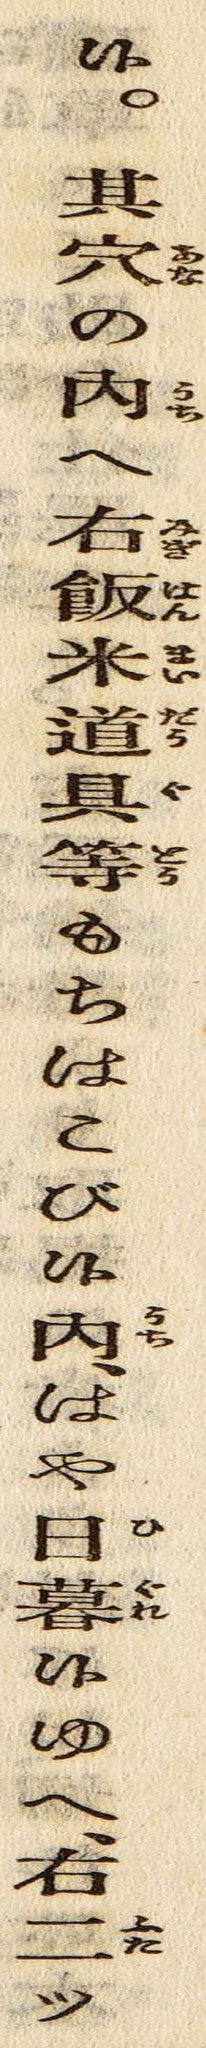候。其穴の内へ右飯米道具等もちはこび候内、はや日暮候ゆへ、右二ツ
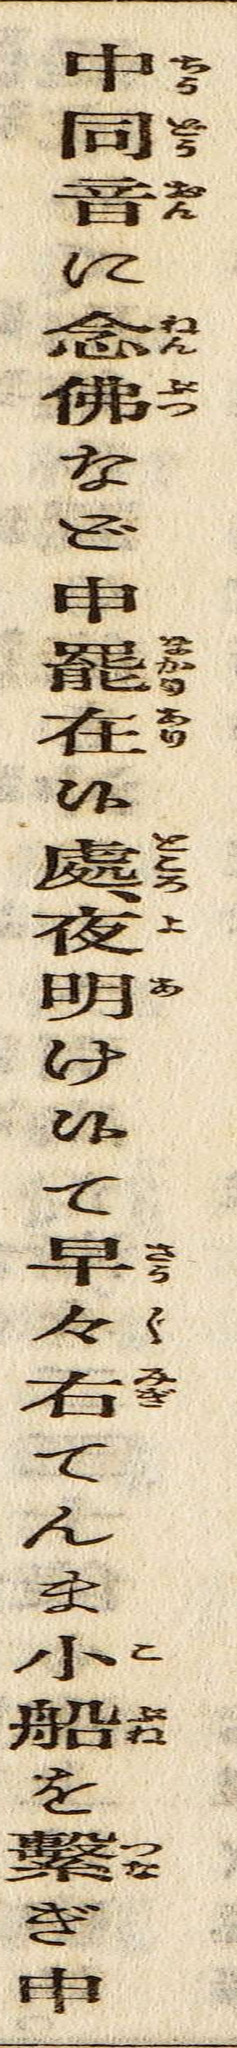中同音に念仏など申罷在候処、夜明け候て早々右てんま小船を繋ぎ申
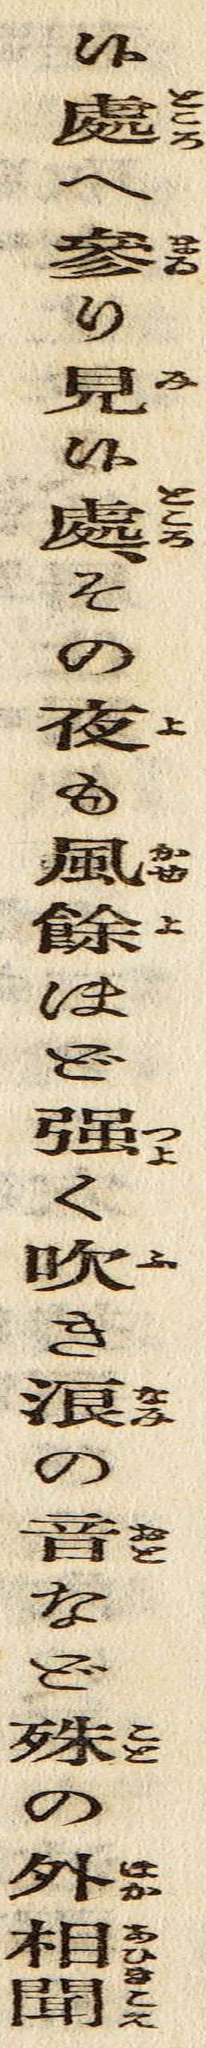候処へ参り見候処、その夜も風余ほど強く吹き浪の音など殊の外相聞
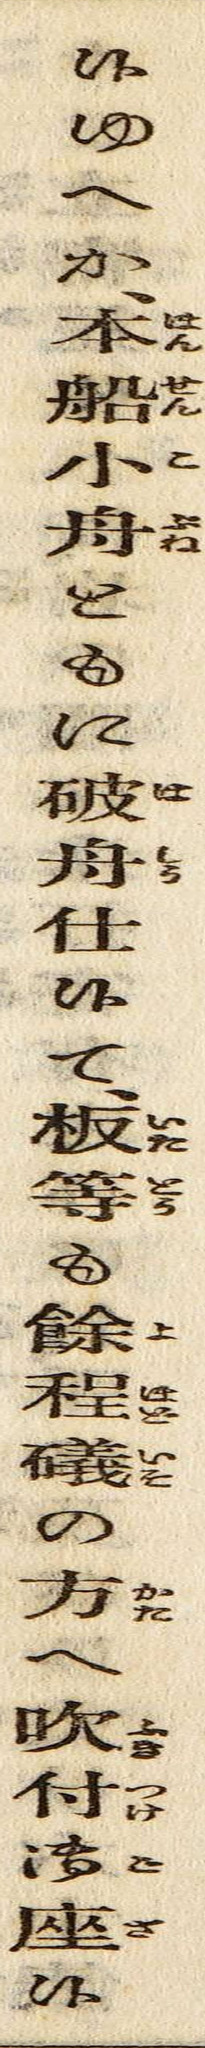候ゆへか、本船小舟ともに破舟仕候て、板等も余程礒の方へ吹付御座候
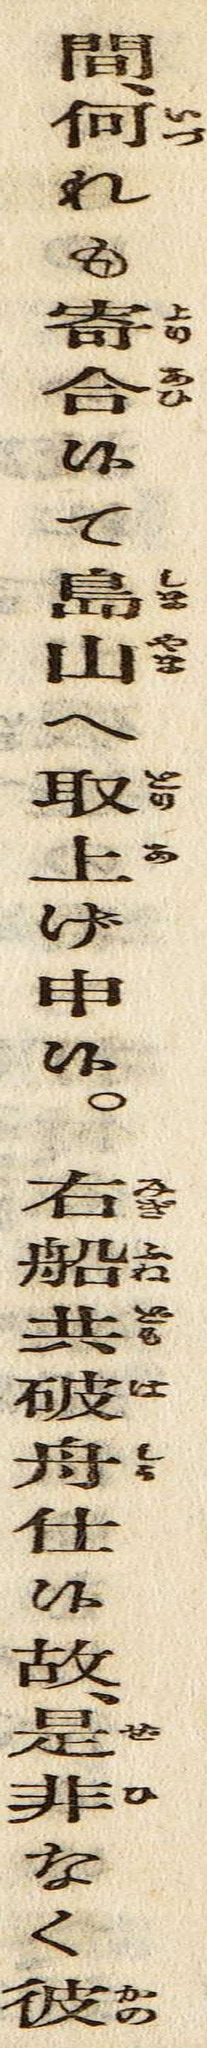間、何れも寄合候て島山へ取上げ申候。右船共破舟仕候故、是非なく彼
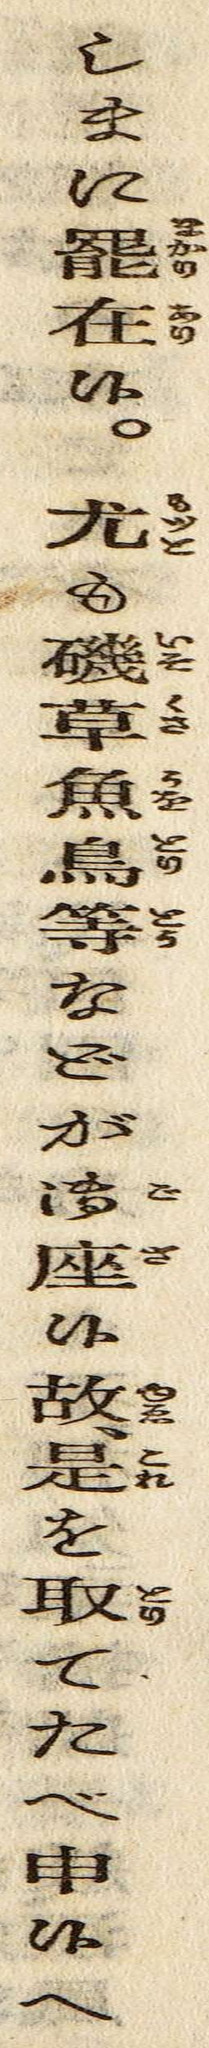しまに罷在候。尤も磯草魚鳥等などが御座候故、是を取てたべ申候へ
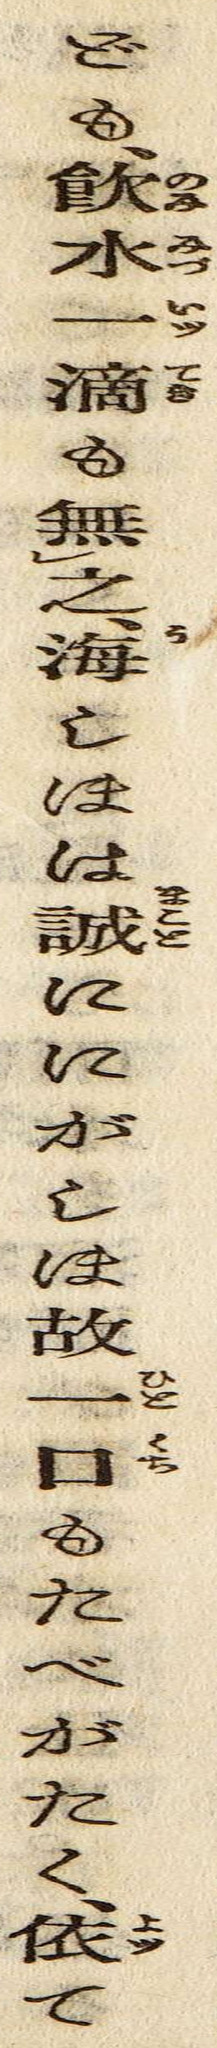ども、飲水一滴も無之、海しほは誠ににがしほ故、一口もたべがたく、依て
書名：日本漂流譚
